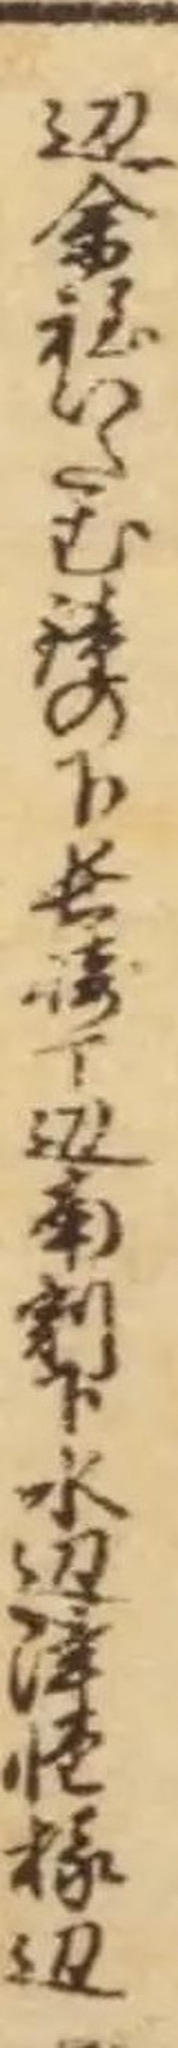辺余程いたむ鐘の下長崎丁辺南割下水辺津軽樣辺
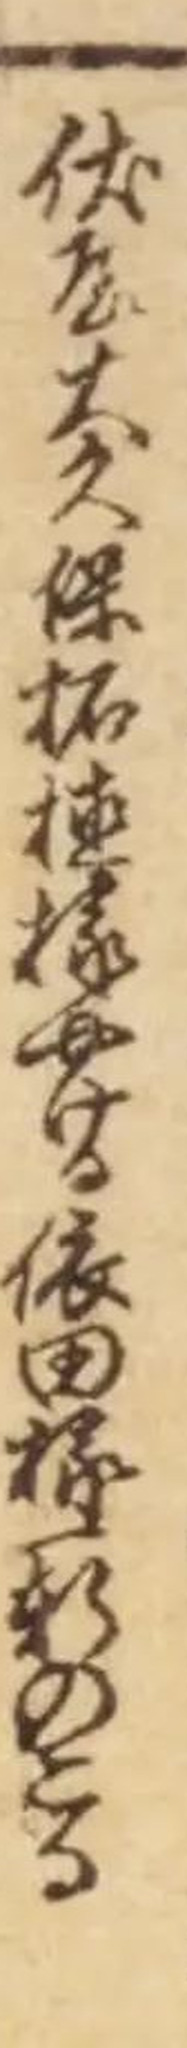伏屋大久保柘植様やける依田様一軒のこる
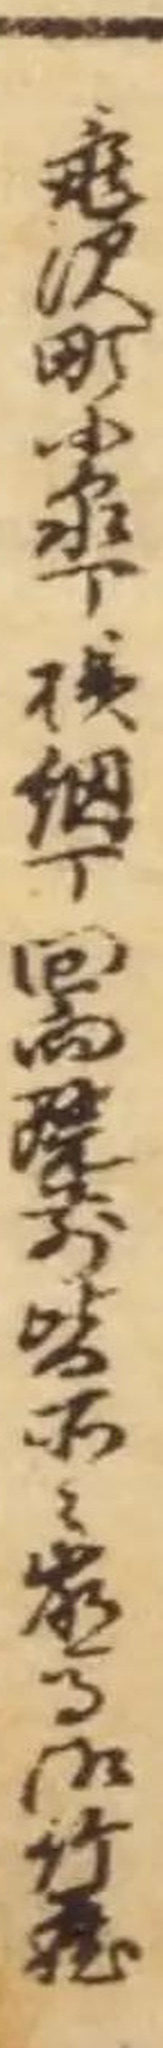亀沢町小泉丁横網丁回向院前皆所〻崩る御竹蔵
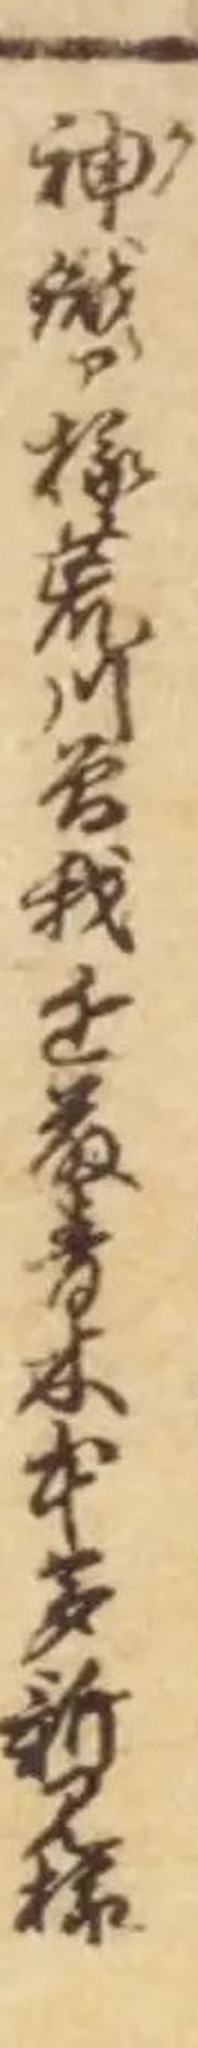神織部様荒川曽我近藤青木本多新見様
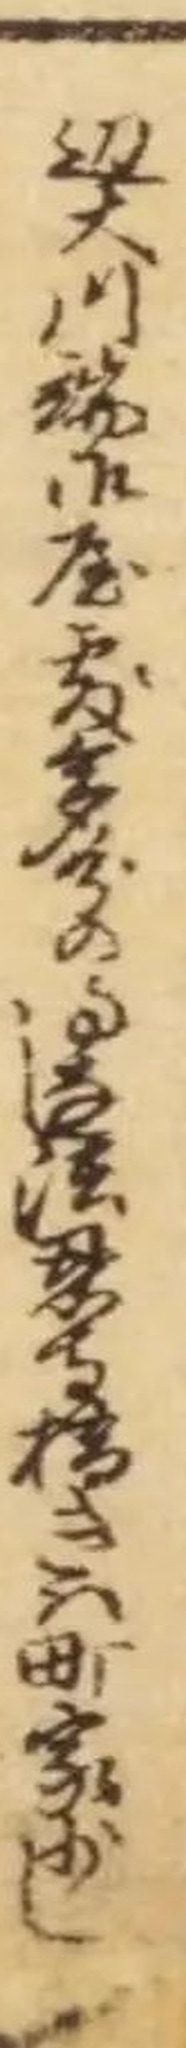辺大川端御屋敷多分の事なし法恩寺橋きは町家少し
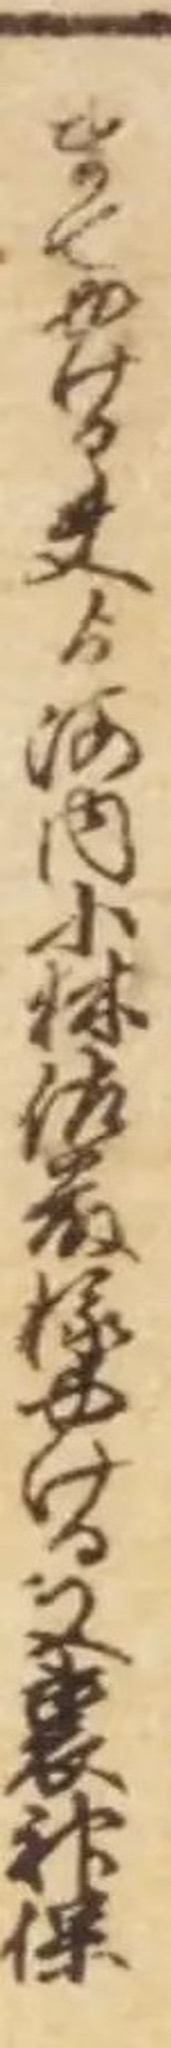までやける夫より河内小林佐藤様やける又裏神保
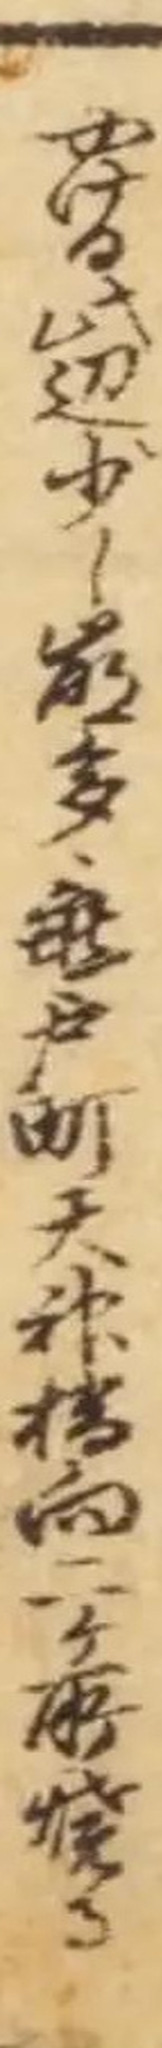やける此辺少し崩多く亀戸町天神橋向二ケ所焼る
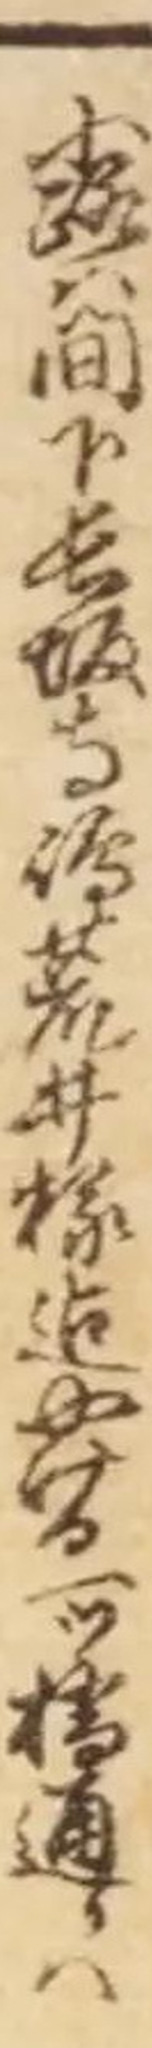小路は間下長坂寺嶋荒井様迄やける一ツ橋通りは
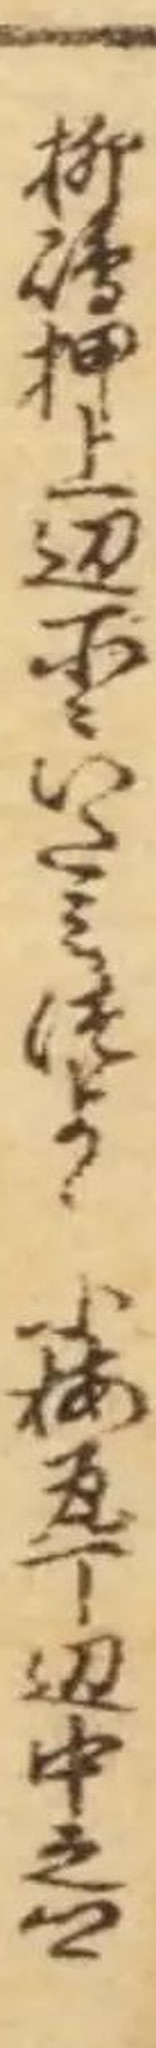柳島押上辺所〻いたみつよく小梅瓦丁辺中の郷
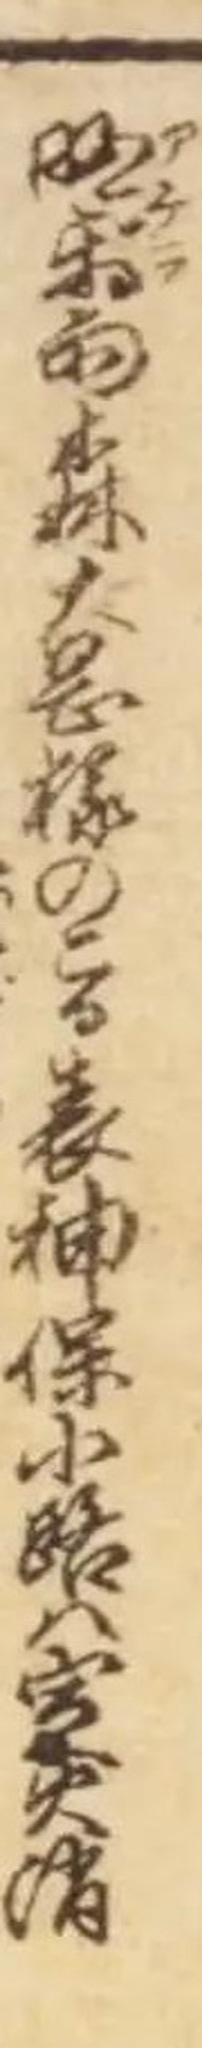明楽雨森大岡様のこる表神保小路は定火消
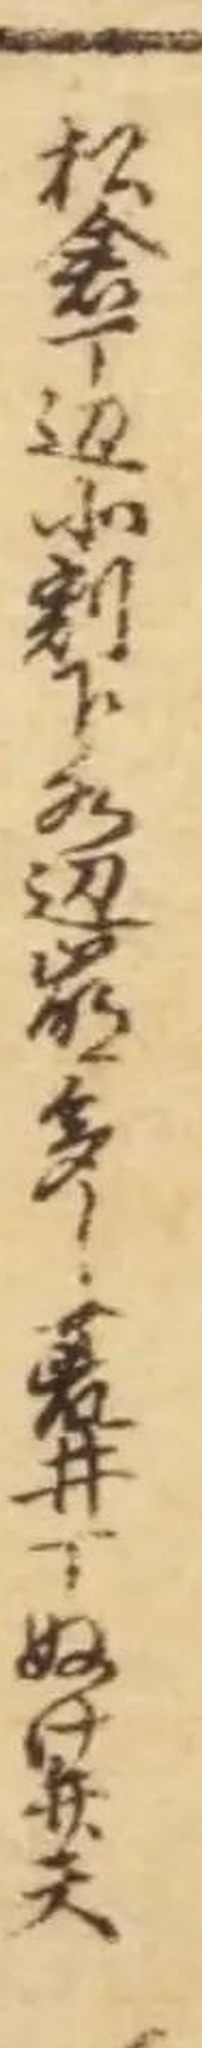松倉丁辺北割下水辺崩多し荒井丁ぬけ弁天
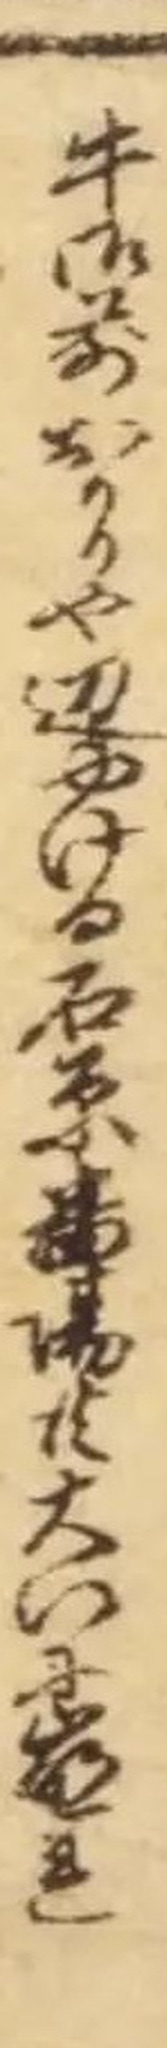牛御前おかりや辺やける石原番場共大いに崩れ
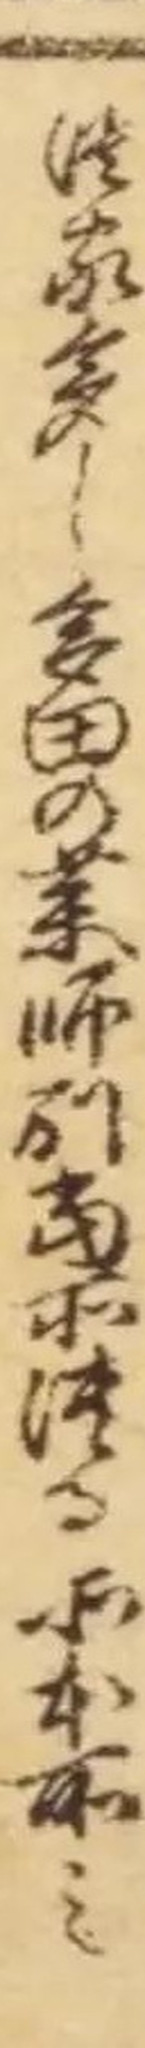潰家多し多田の藥師別当所潰る所本所之
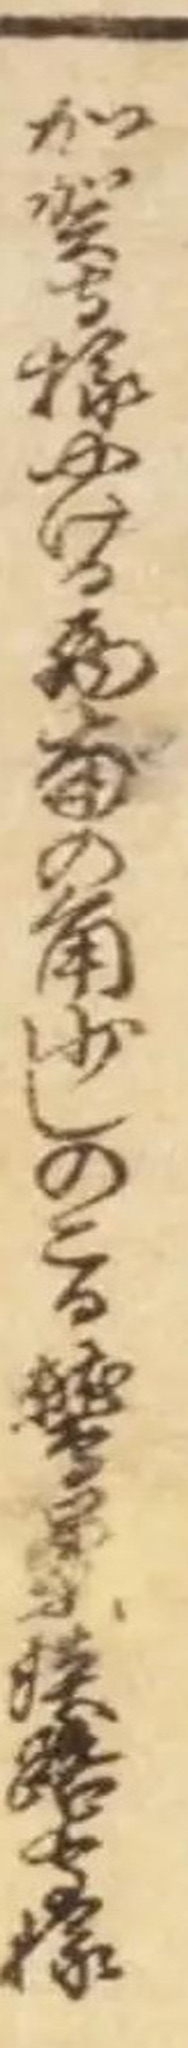加賀守様やける西南の角少しのこる鷲巣淡路守様
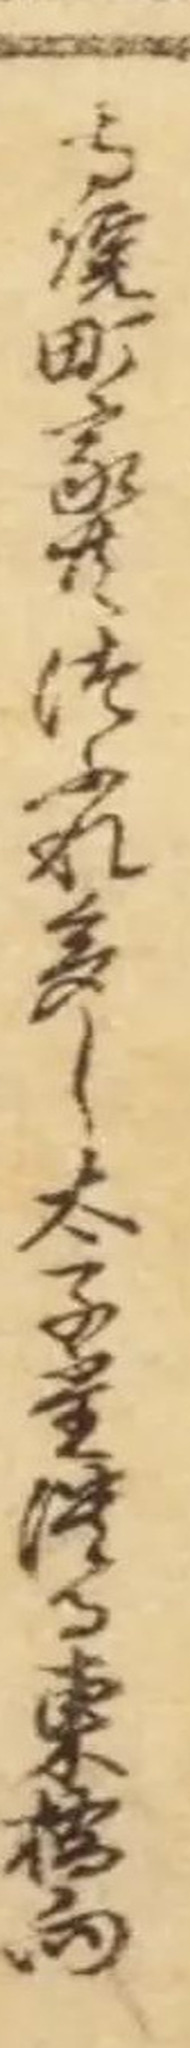寺院町家共つぶれ多し太子堂潰る東橋向
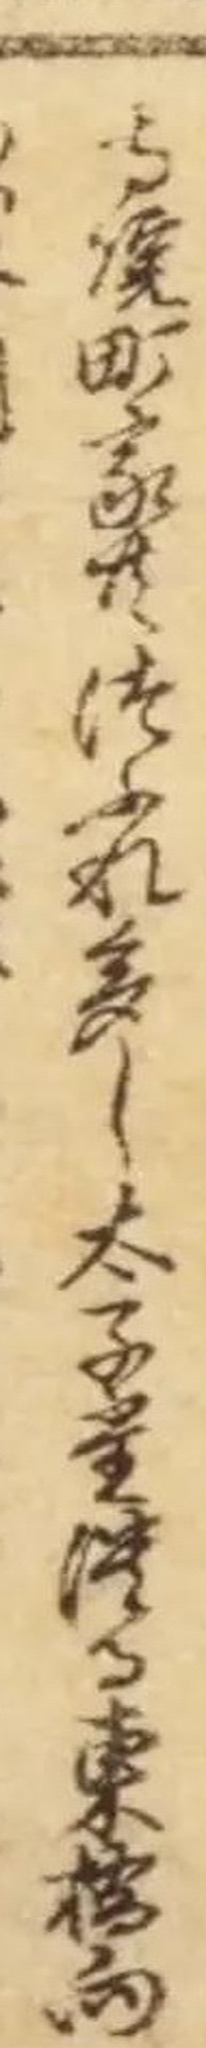寺院町家共つぶれ多し太子堂潰る東橋向
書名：御江戸関八州大地震出火巨細記
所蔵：国立国会図書館 National Diet Library, JAPAN
